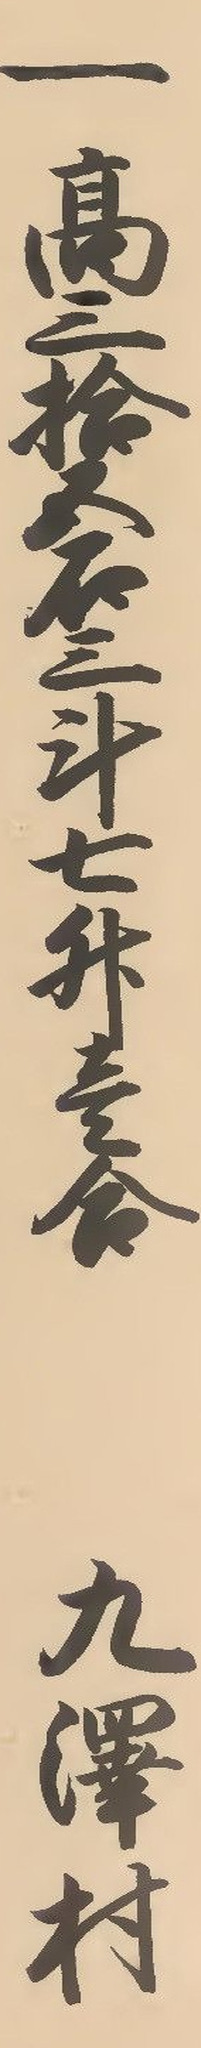一高三拾五石三斗七升壱合九沢村
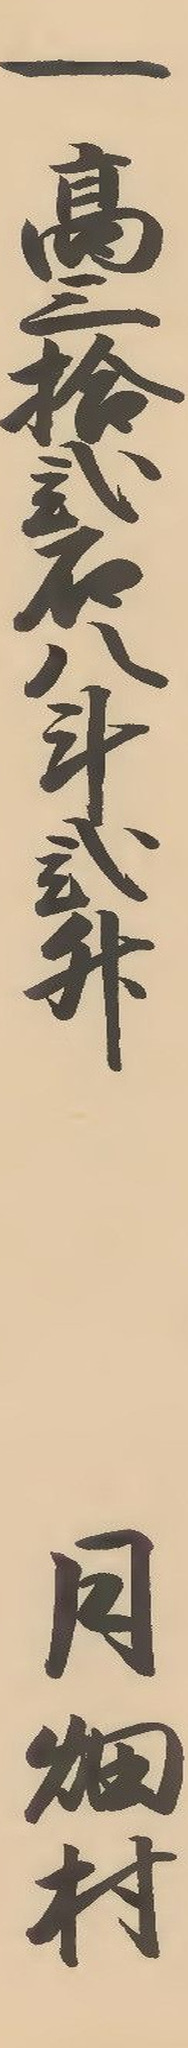一高三拾弐石八斗弐升月畑村
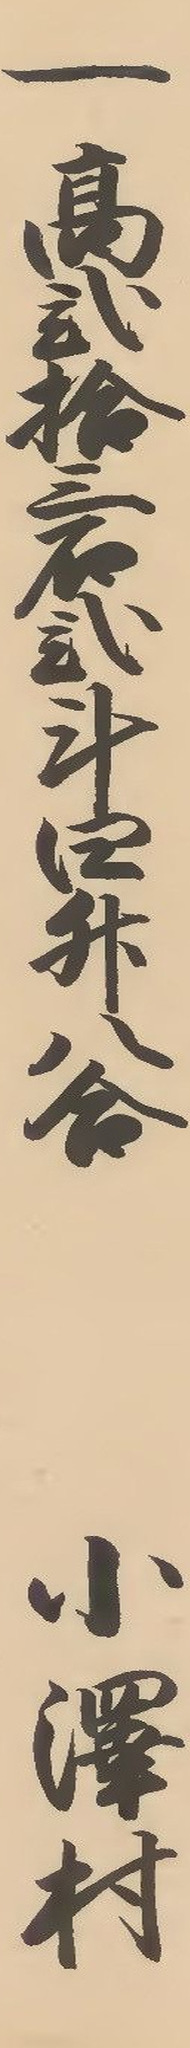一高弐拾三石弐斗四升八合小沢村
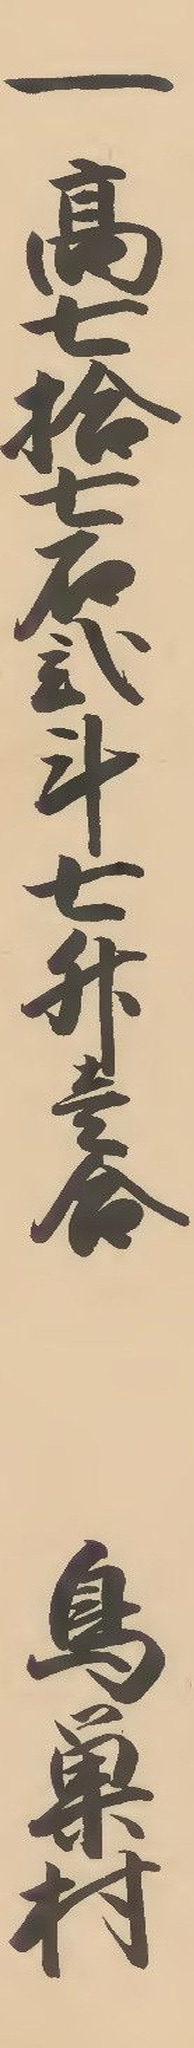一高七拾七石弐斗七升壱合鳥巣村

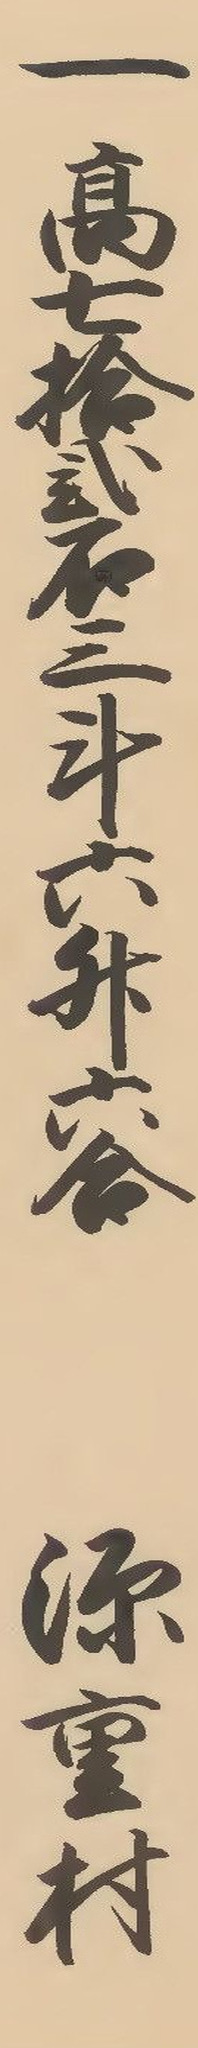一高七拾弐石三斗六升六合源重村
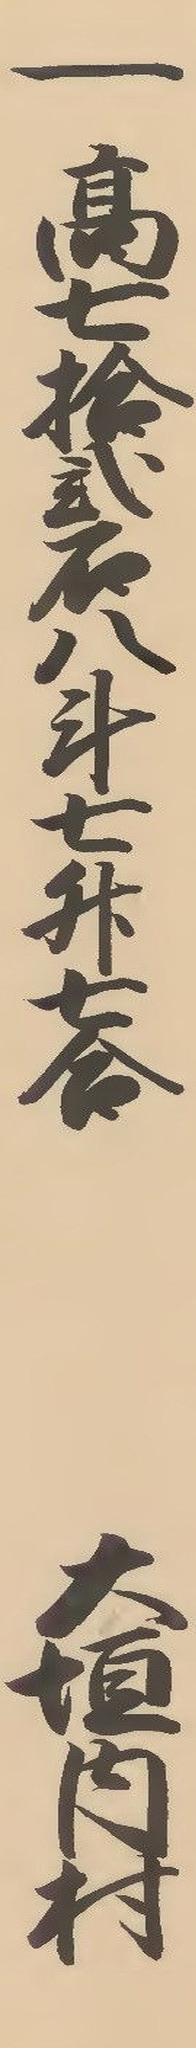一高七拾弐石八斗七升七合大垣内村
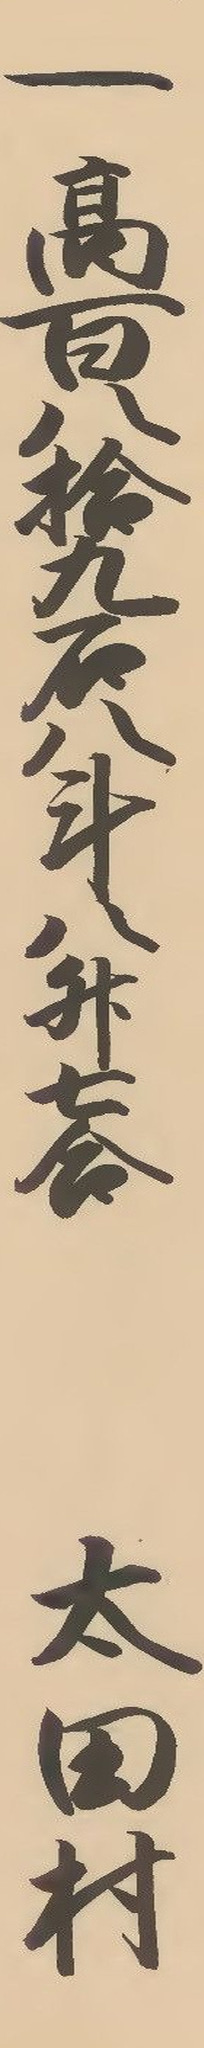一高百八拾九石八斗八升七合太田村
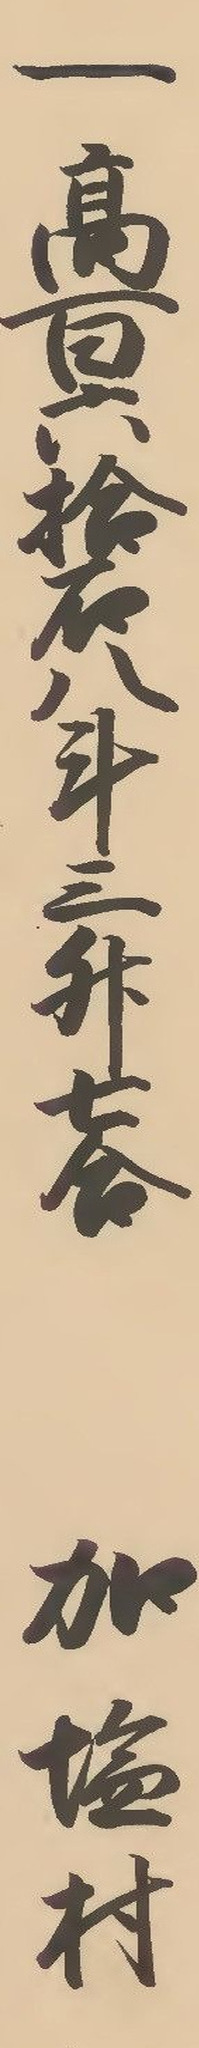一高百六拾石八斗三升七合加塩村
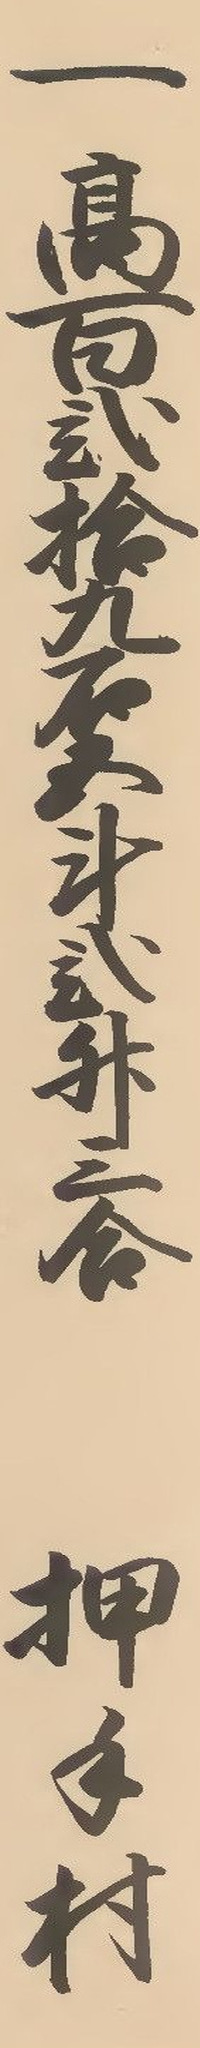一高百弐拾九石五斗弐升三合押手村
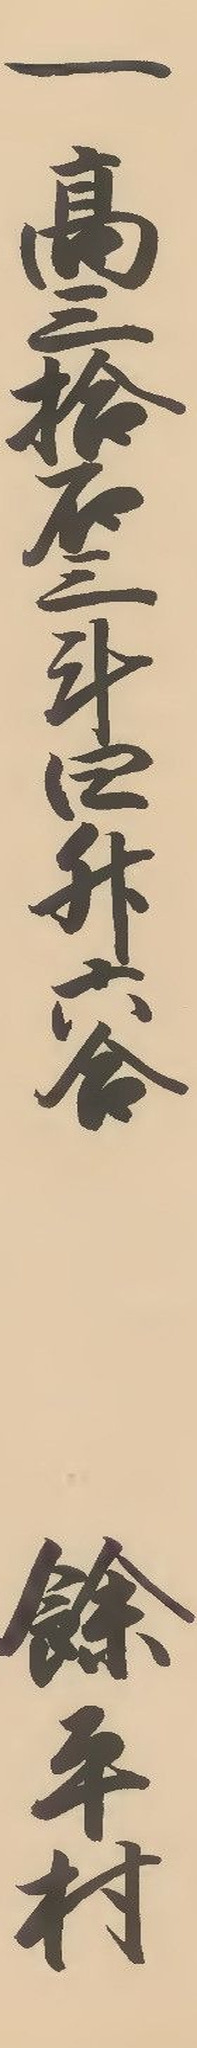一高三拾石三斗四升六合余平村
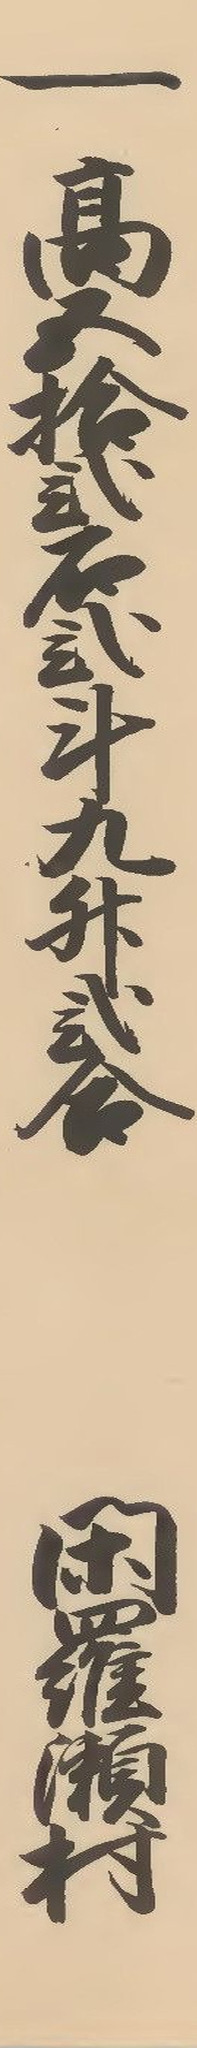一高五拾弐石弐斗九升弐合閑羅瀬村
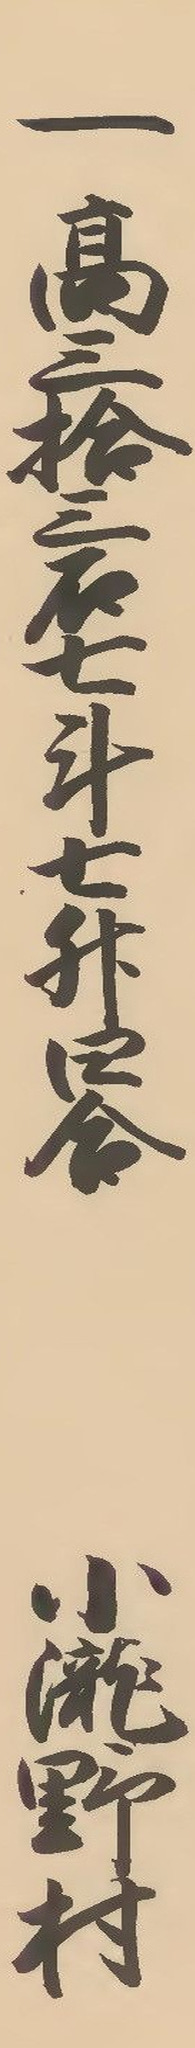一高三拾三石七斗七升四合小滝野村

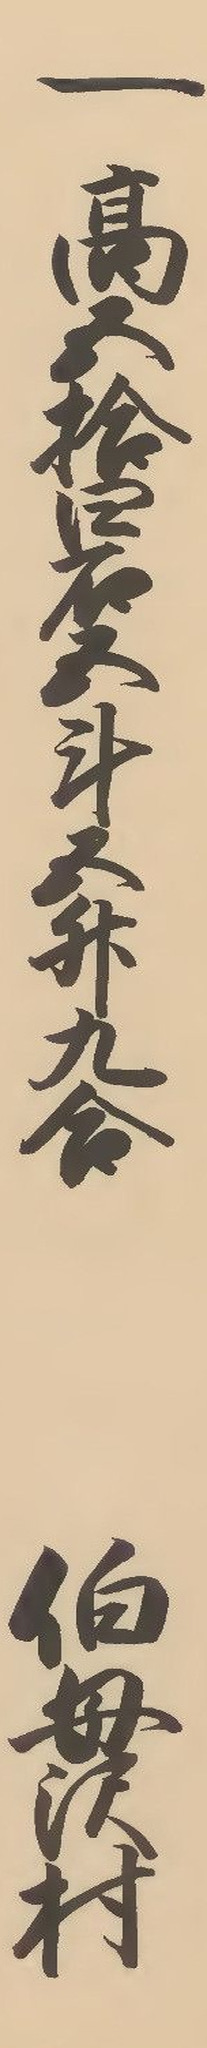一高五拾四石五斗五升九合伯母沢村
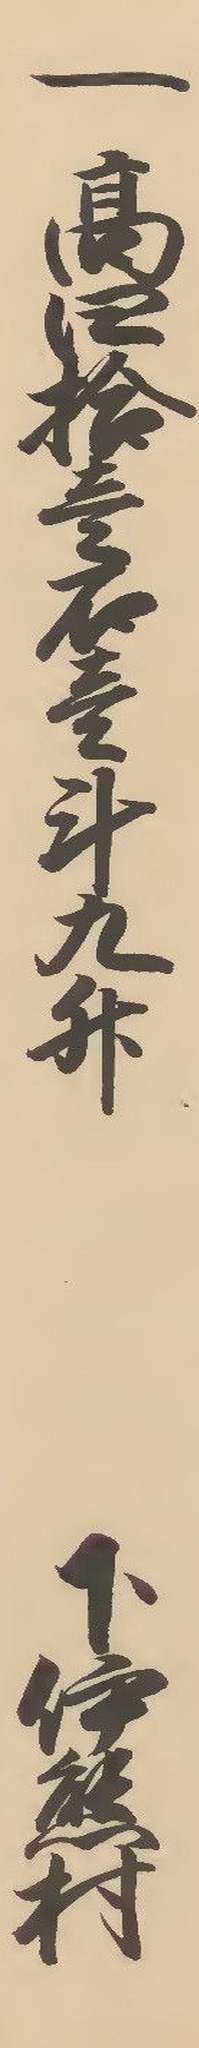一高四拾壱石壱斗九升下伊熊村
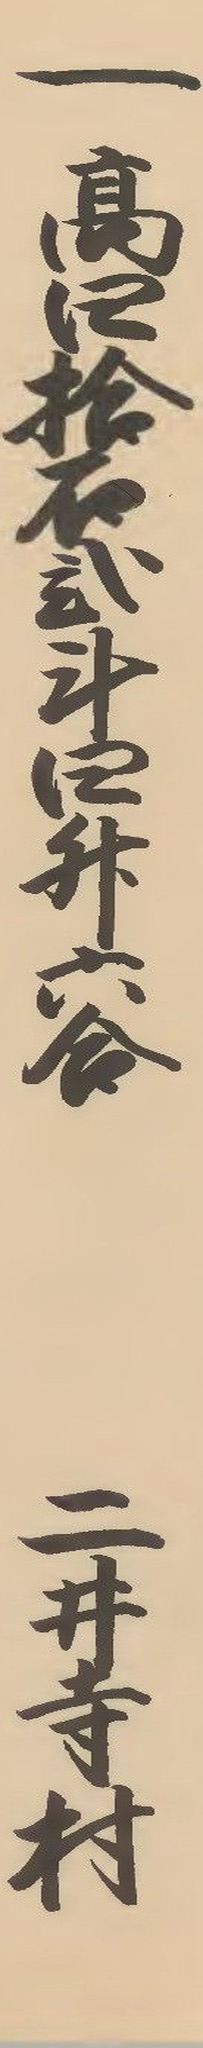一高四拾石弐斗四升六合二井寺村
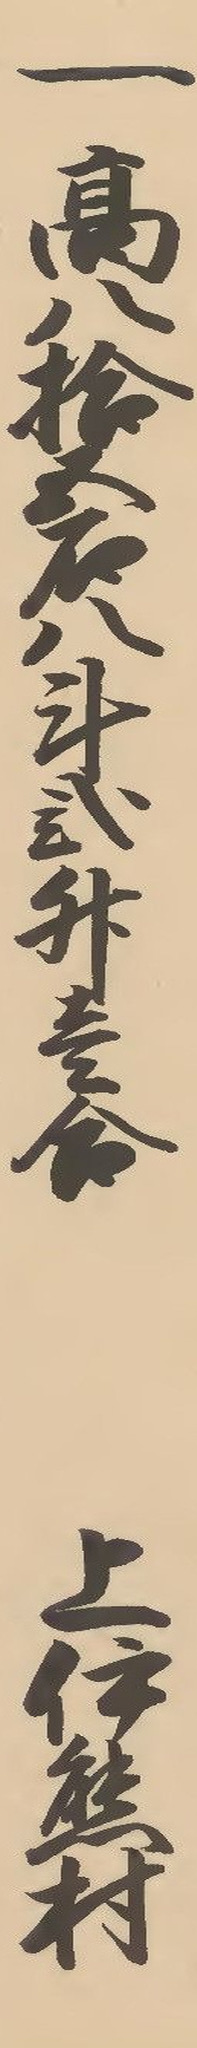一高八拾五石八斗弐升壱合上伊熊村
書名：三河国郷帳
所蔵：国立公文書館 National Archives of Japan
